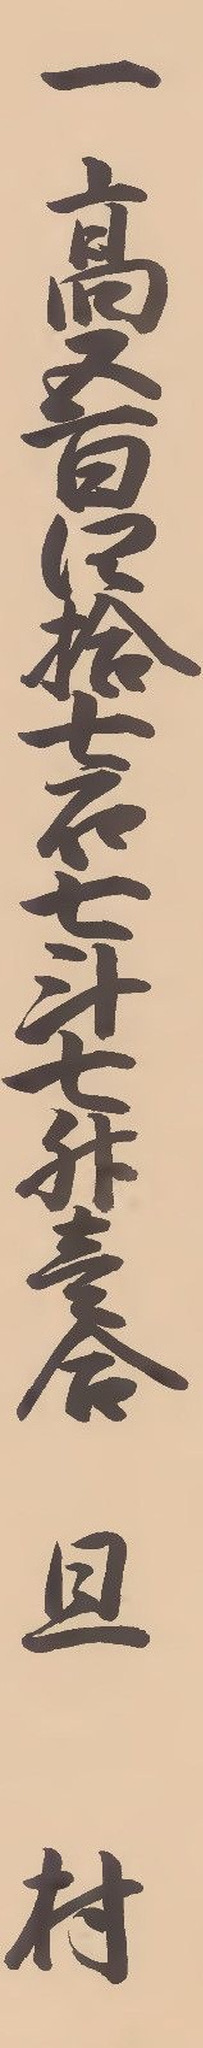一高五百四拾七石七斗七升壱合旦村
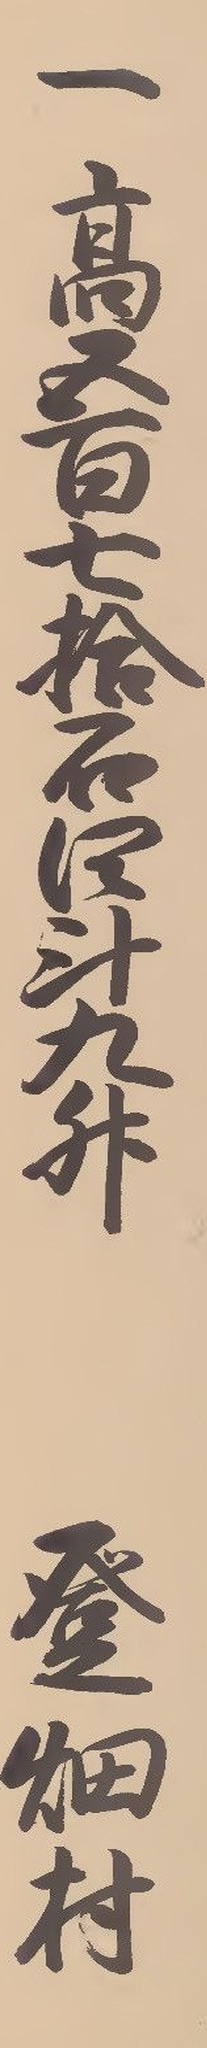一高五百七拾石四斗九升登畑村
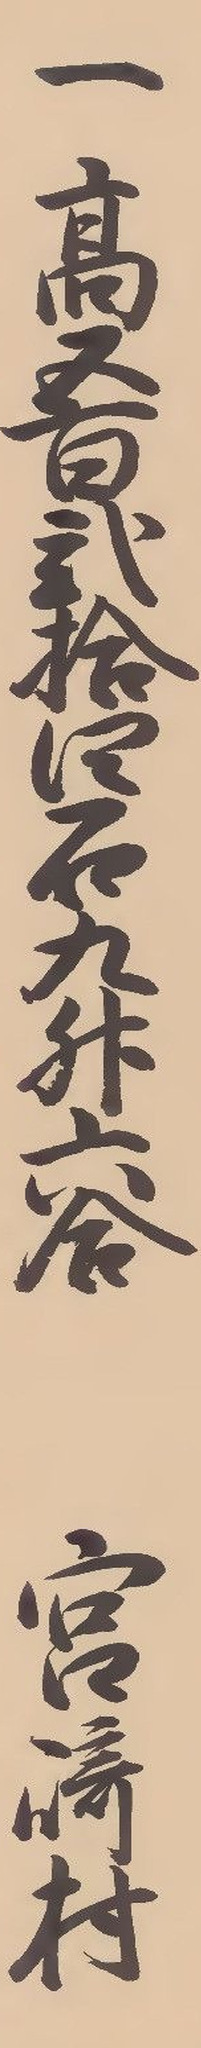一高五百弐拾四石九升六合宮崎村
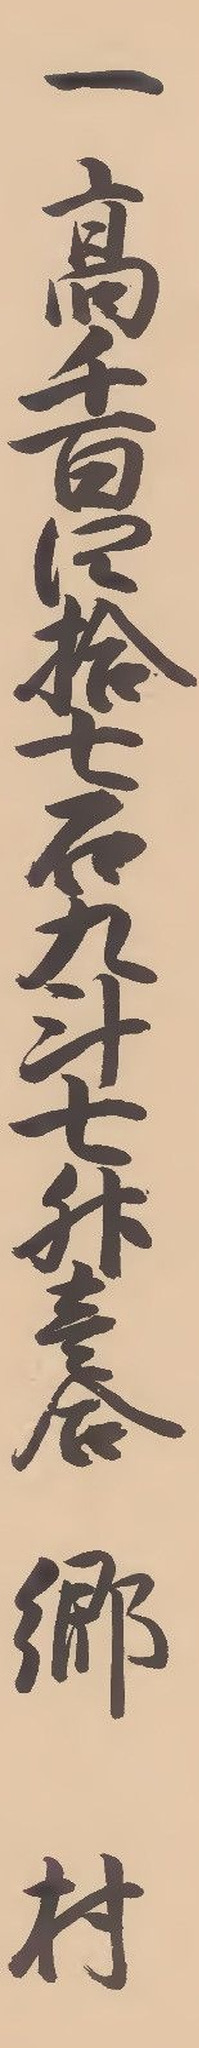一高千百四拾七石九斗七升壱合郷村
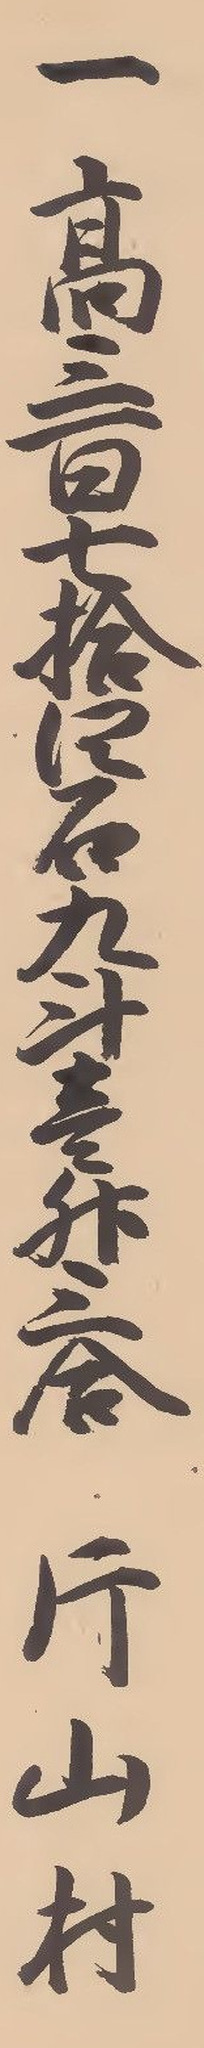一高三百七拾四石九斗壱升三合片山村

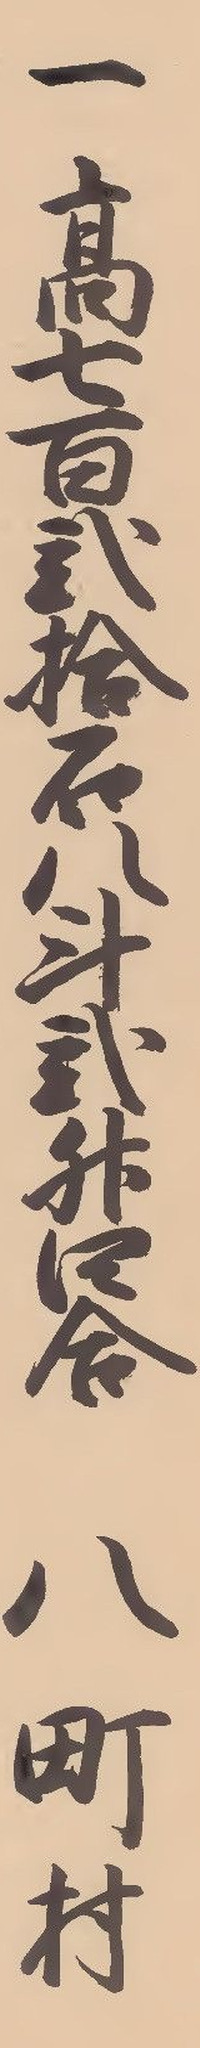一高七百弐拾石八斗弐升四合八町村
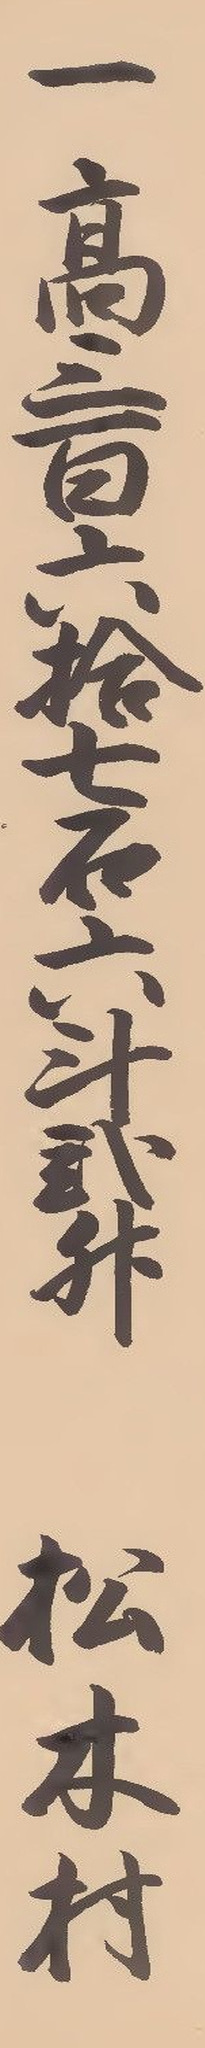一高三百六拾七石六斗弐升松木村
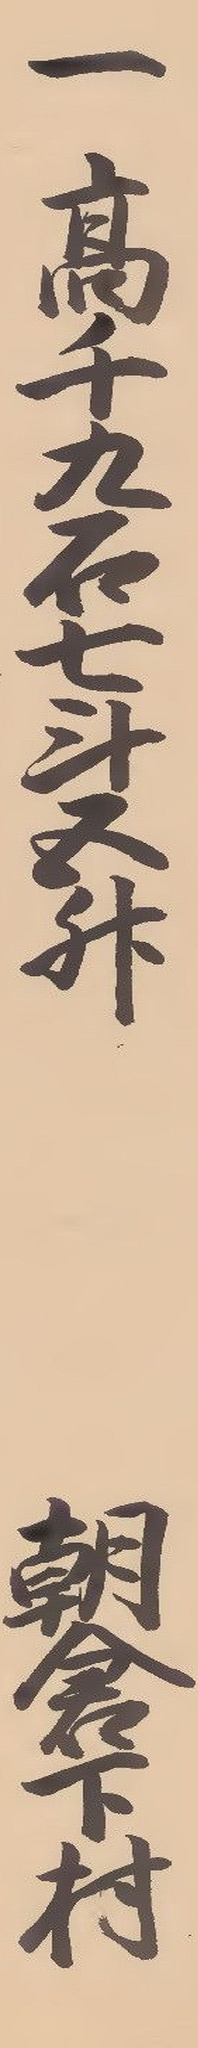一高千九石七斗五升朝倉下村
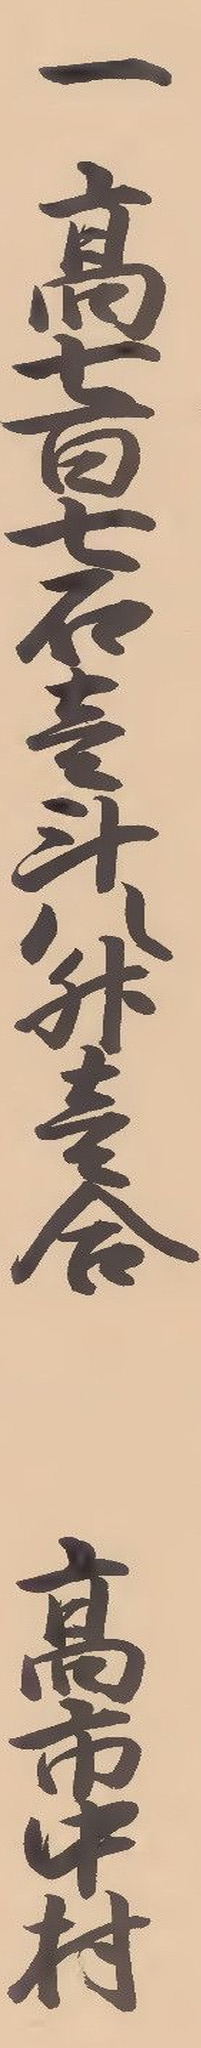一高七百七石壱斗八升壱合高市中村
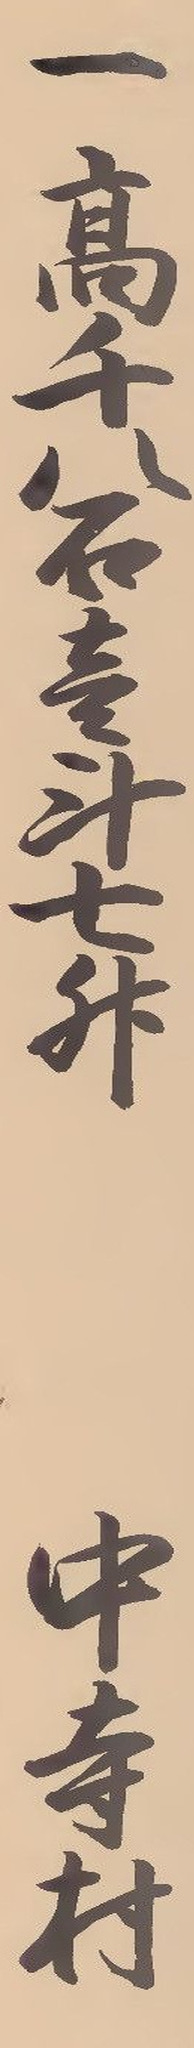一高千八石壱斗七升中寺村
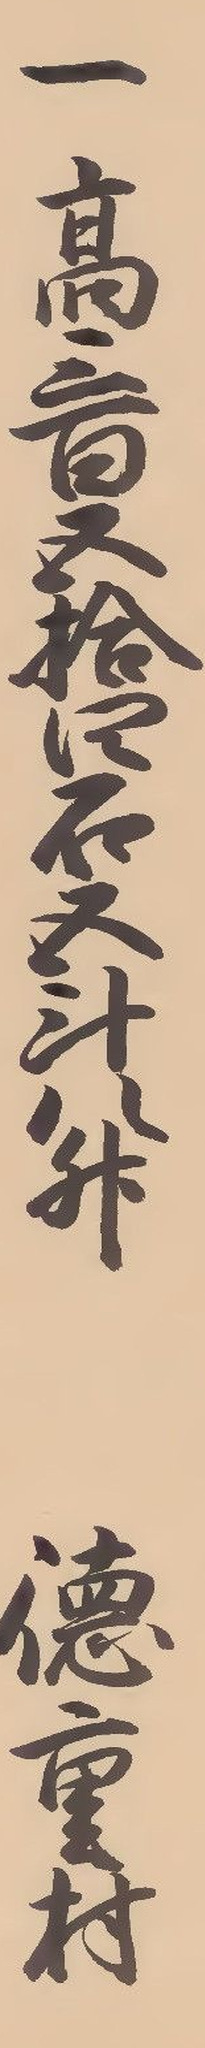一高三百五拾四石五斗八升徳重村
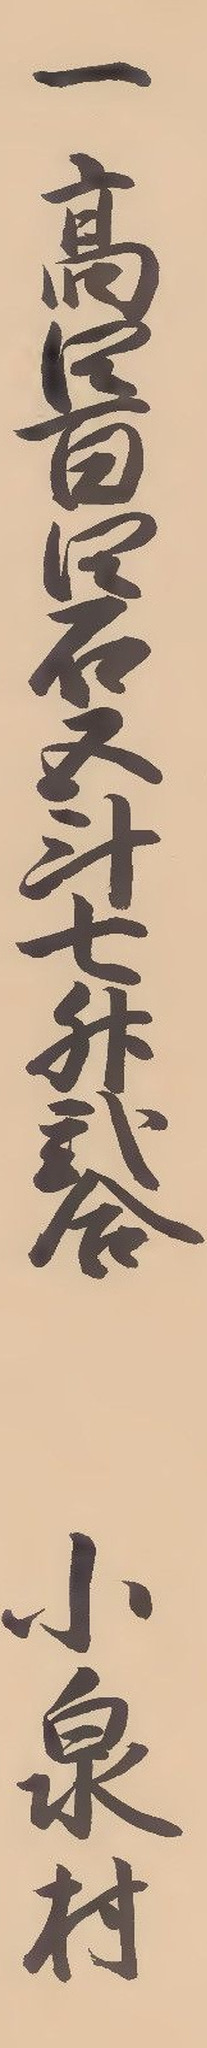一高四百四石五斗七升弐合小泉村
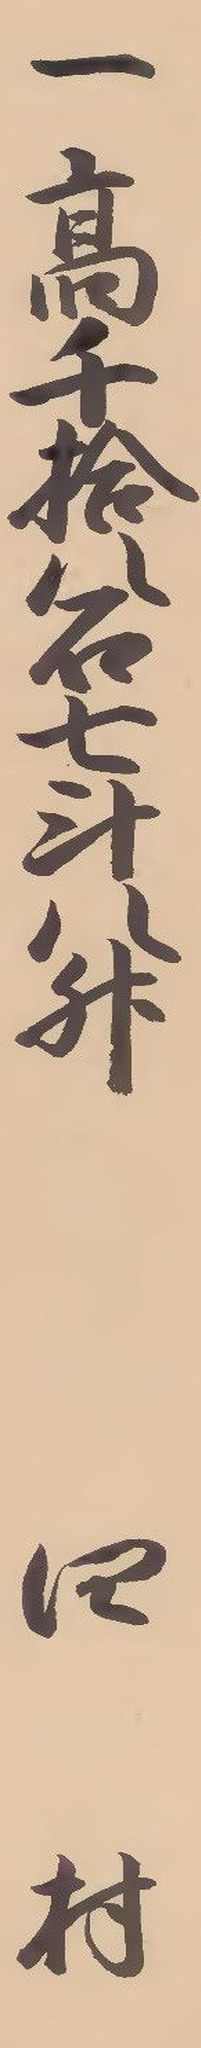一高千拾八石七斗八升四村

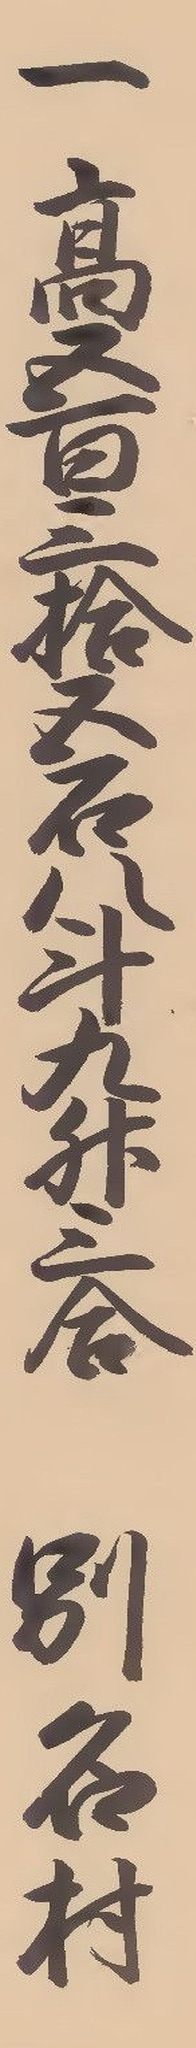一高五百三拾五石八斗九升三合別名村
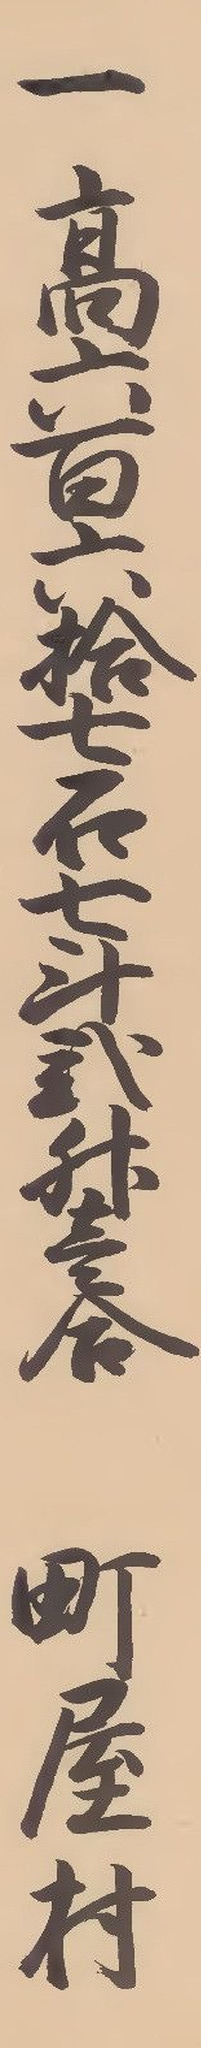一高六百六拾七石七斗弐升壱合町屋村
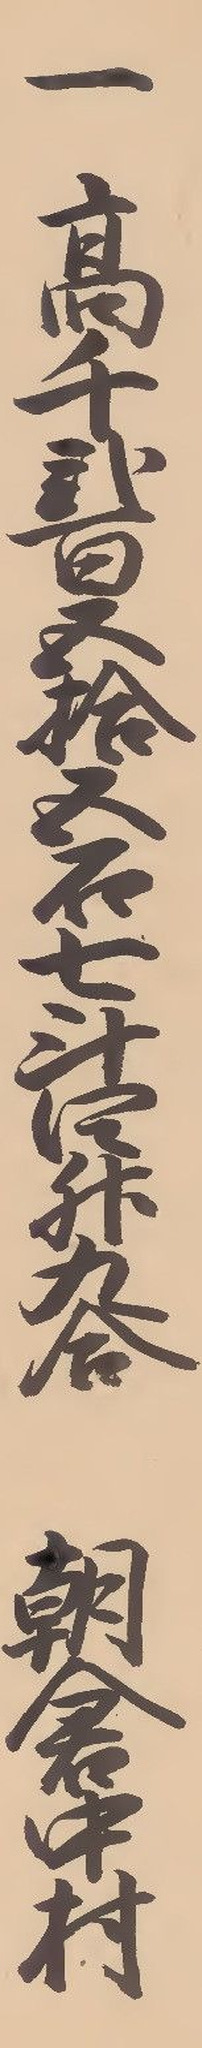一高千弐百五拾五石七斗四升九合朝倉中村
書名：伊予国郷帳
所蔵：国立公文書館 National Archives of Japan
